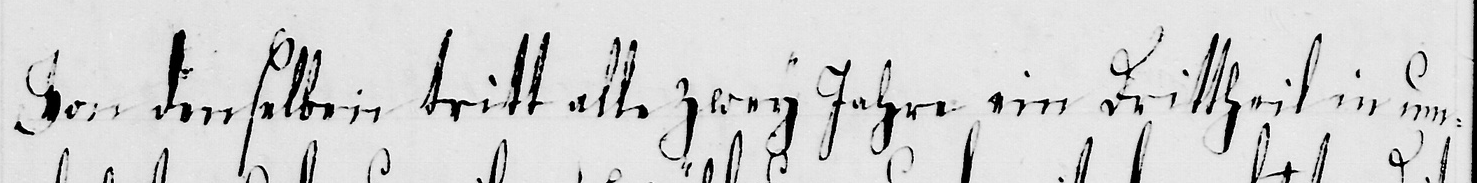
Von demselben tritt alle zwey Jahre ein Drittheil in um¬
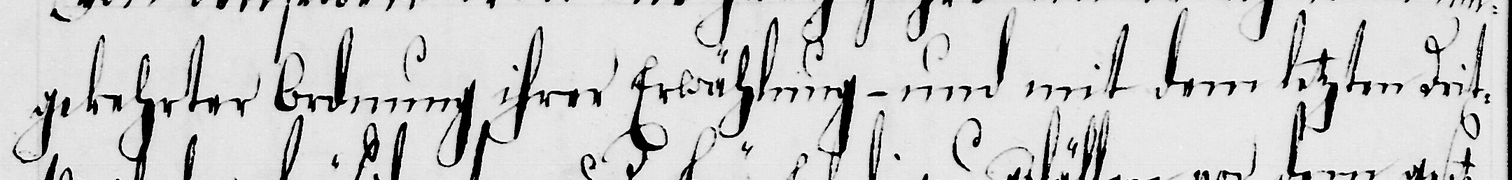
gekehrter Ordnung ihrer Erwählung – und mit dem letzten Dr¬
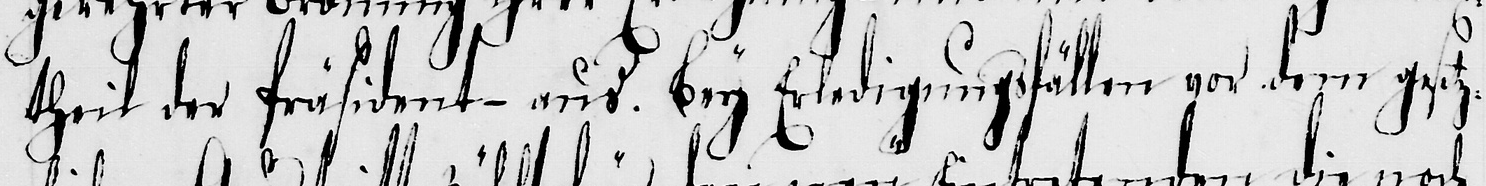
theil der Präsident – aus. Bey Erledigungsfällen vor dem geset¬
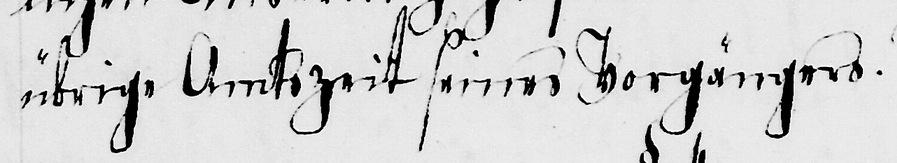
übrige Amtszeit seines Vorgängers.
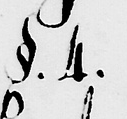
§. 4.
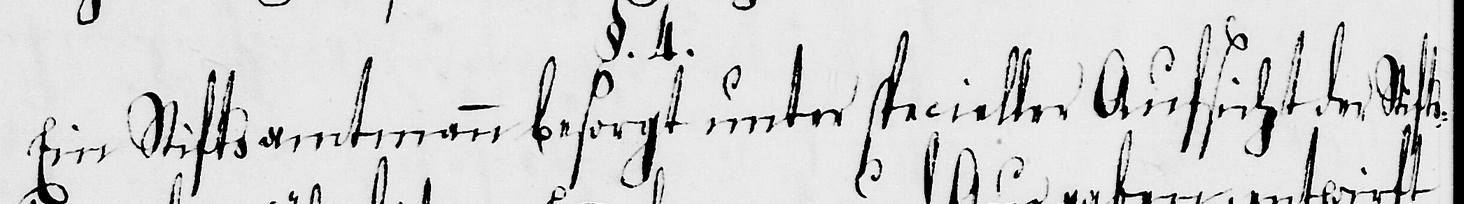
Ein Stiftsamtmann besorgt unter specieller Aufsicht der St¬
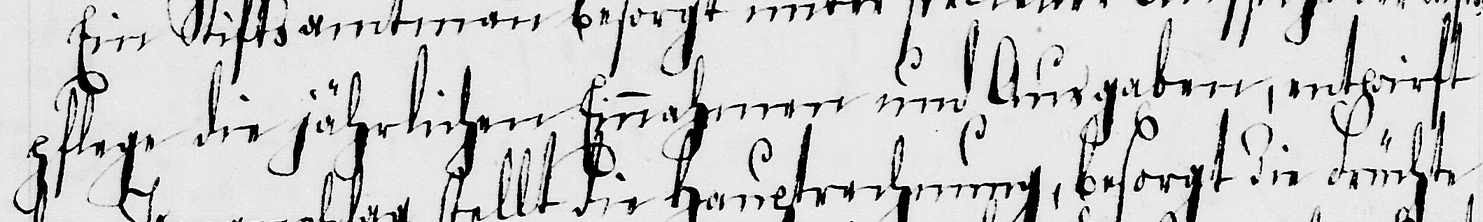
spflege die jährlichen Einnahmen und Ausgaben, entwirft
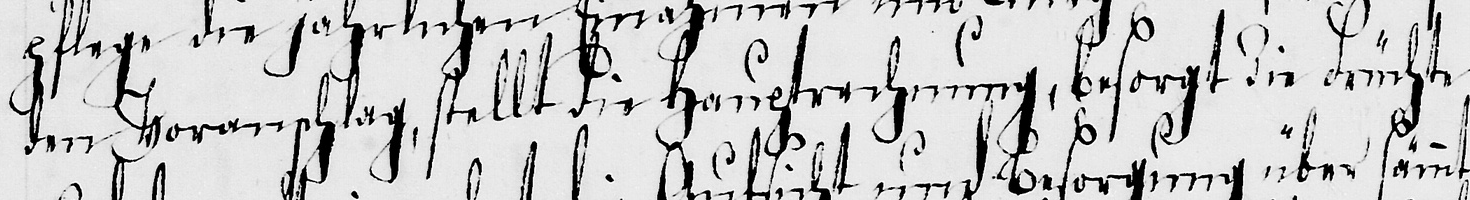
den Voranschlag, stellt die Hauptrechnung, besorgt die Früchte
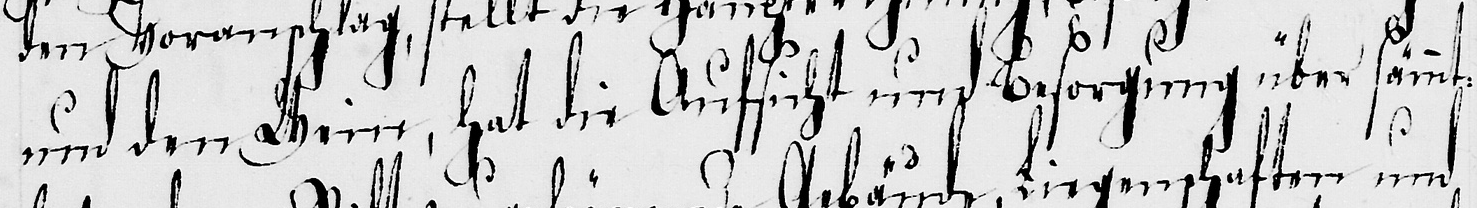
und den Wein, hat die Aufsicht und Besorgung über säm¬
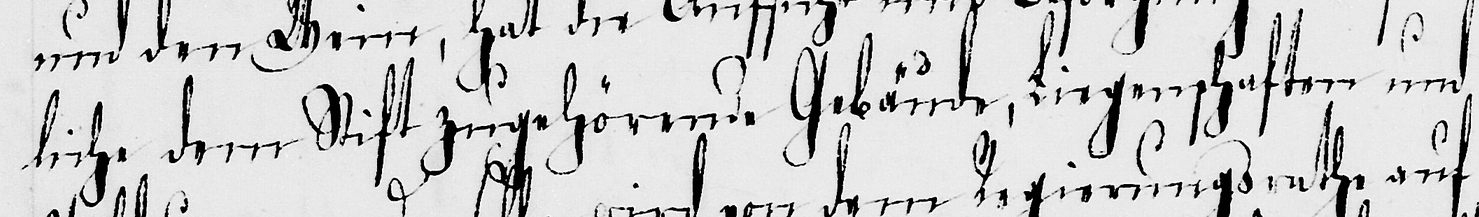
liche dem Stift zugehörende Gebäude, Liegenschaften und
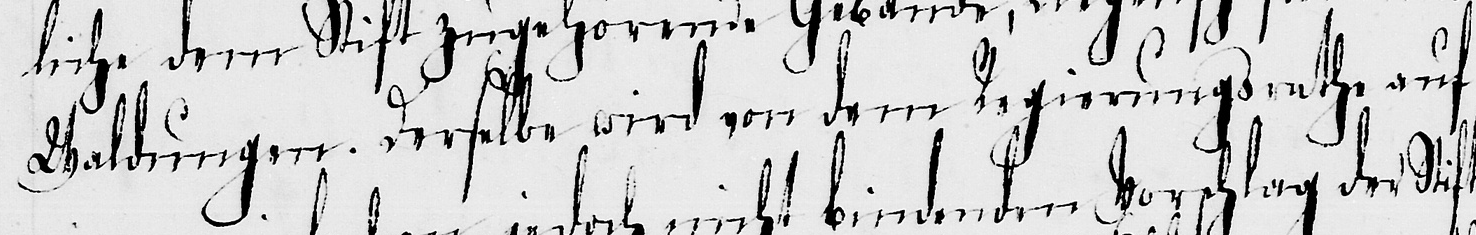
Waldungen. Derselbe wird von dem Regierungsrathe auf
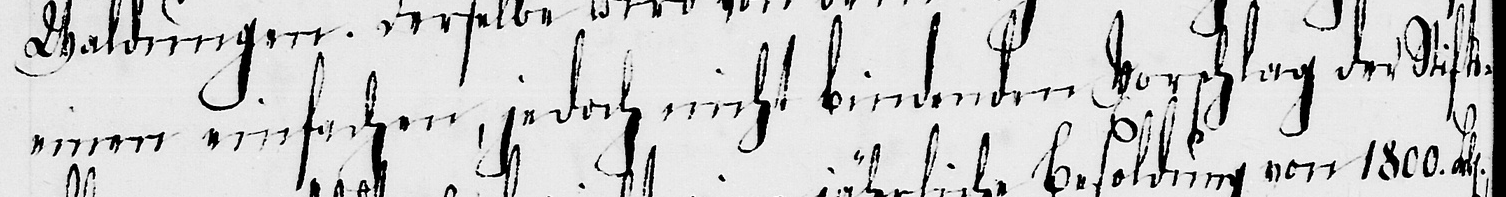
einen einfachen, jedoch nicht bindenden Vorschlag der Stif¬
